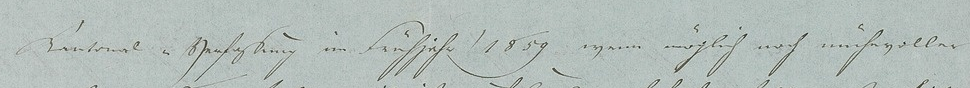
Kantonal-Verfassung im Frühjahr 1859 wenn möglich noch mühevoller
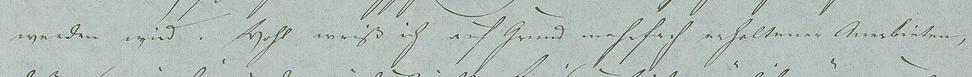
werden wird. Wohl weiß ich auf Grund mehrfach erhaltener Anerbieten,
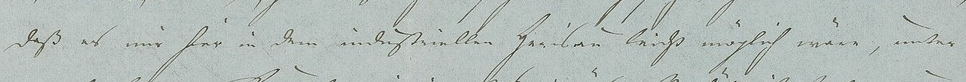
daß es mir hier in dem industriellen Herisau leicht möglich wäre, unter
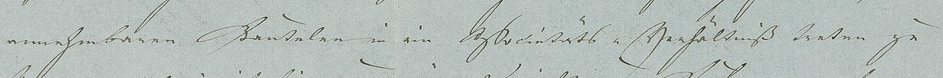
annehmbaren Kautelen in ein Associetäts-Verhältniß treten zu
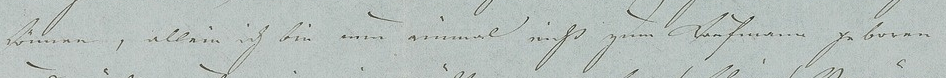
können, allein ich bin nun einmal nicht zum Kaufmann geboren
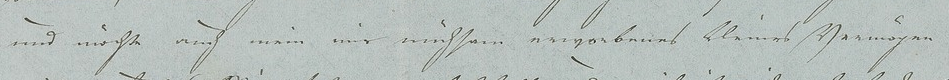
und möchte auch mein mir mühsam erworbenes kleines Vermögen
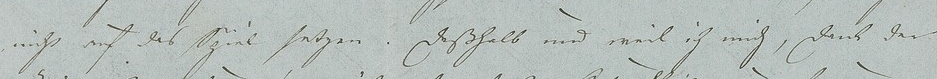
nicht auf das Spiel setzen. Deßhalb und weil ich mich, dank der
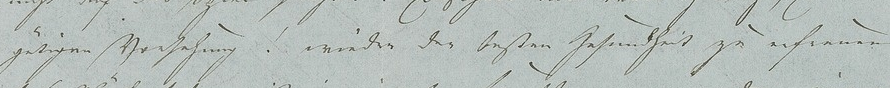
gütigen Vorsehung! wieder der besten Gesundheit zu erfreuen
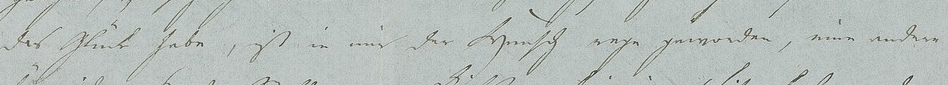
das Glück habe, ist in mir der Wunsch rege geworden, eine andere
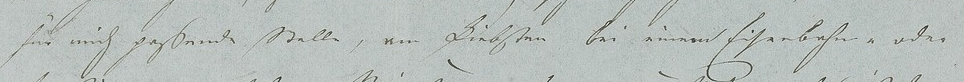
für mich passende Stelle, am Liebsten bei einem Eisenbahn- oder
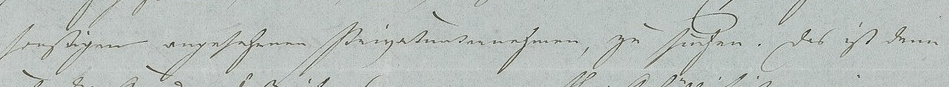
sonstigen angesehenen Privatunternehmen, zu suchen. Das ist denn
